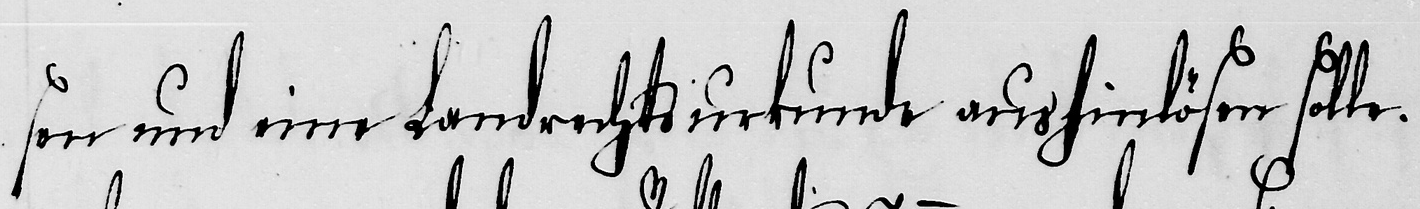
sen und eine Landrechtsurkunde aushinlösen sol¬
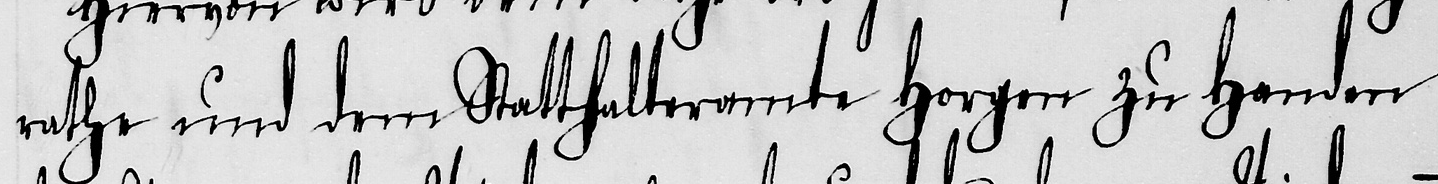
rathe und dem Statthalteramte Horgen zu Handen
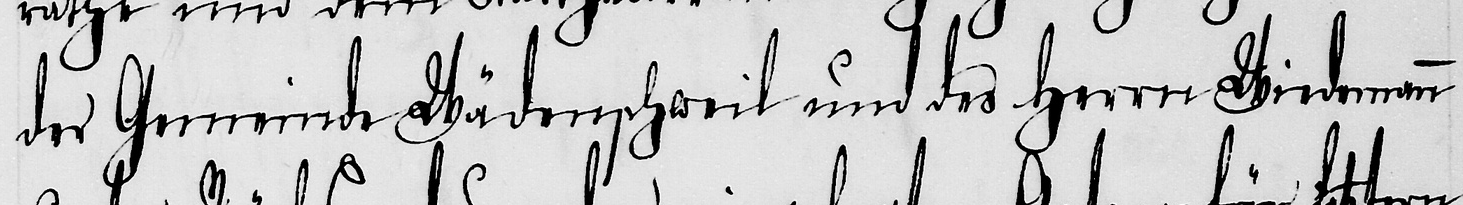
der Gemeinde Wädenschweil und des Herrn Wiedemann
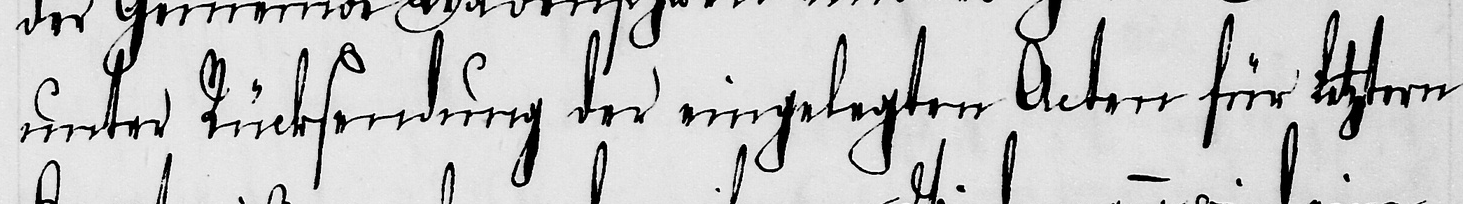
unter Rücksendung der eingelegten Acten für Letzte¬
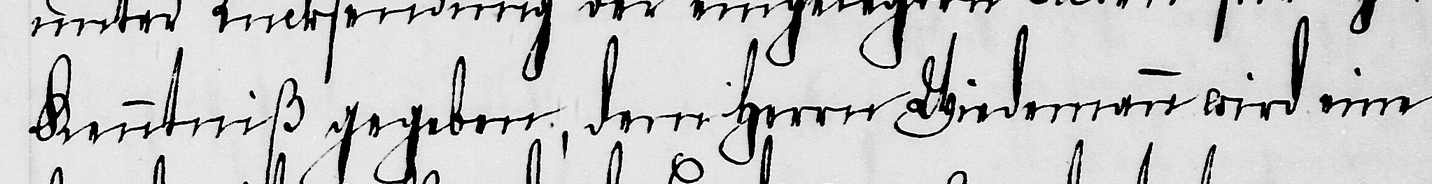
Kenntniß gegeben, dem Herrn Wiedemann wird eine
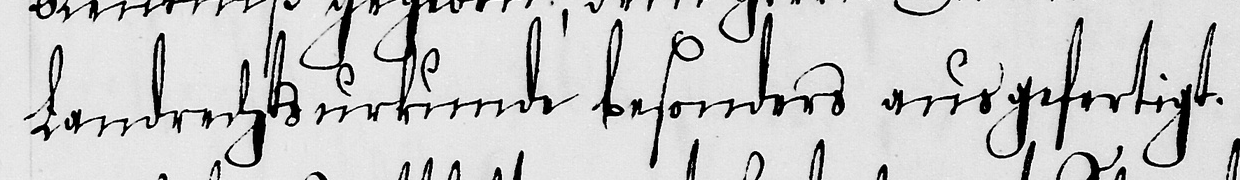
Landrechtsurkunde besonders ausgefertigt.
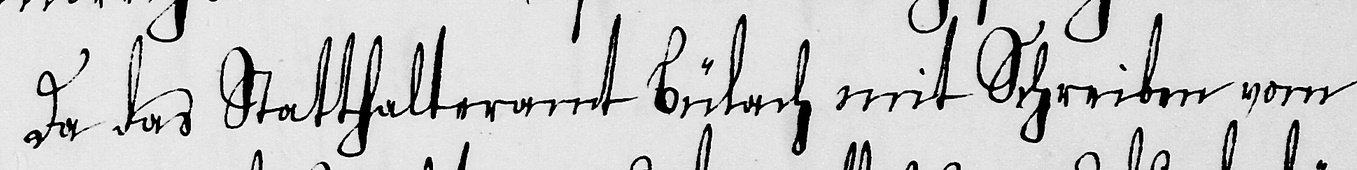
Da das Statthalteramt Bülach mit Schreiben vom
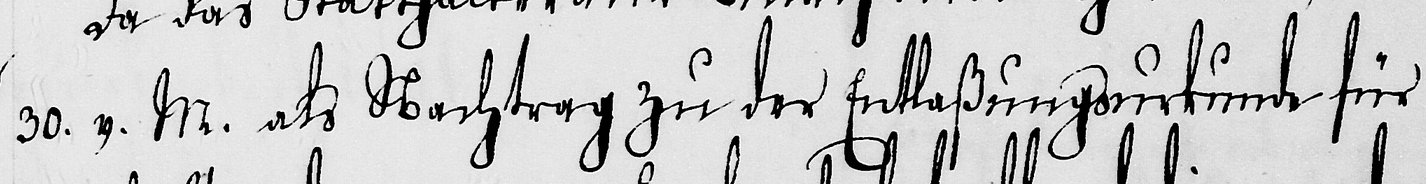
30. v. M. als Nachtrag zu der Entlaßungsurkunde für
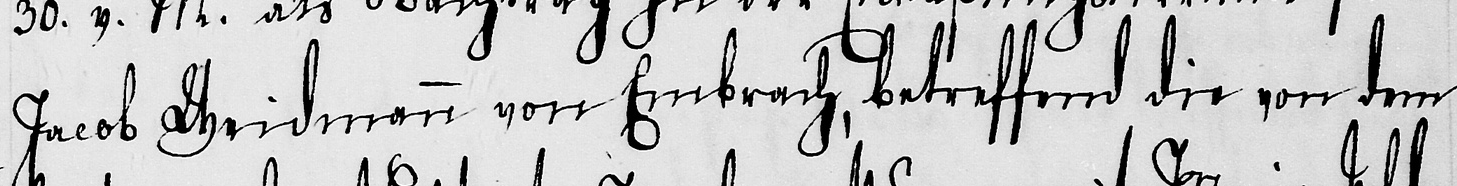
Jacob Weidmann von Embrach, betreffend die von dem
